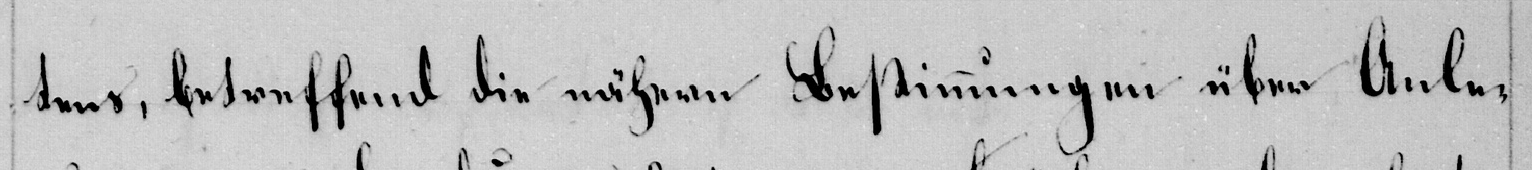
tens, betreffend die nähern Bestimmungen über Anle¬
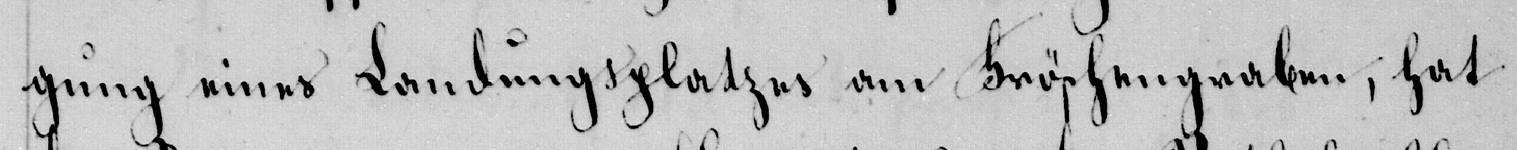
gung eines Landungsplatzes am Fröschengraben, hat
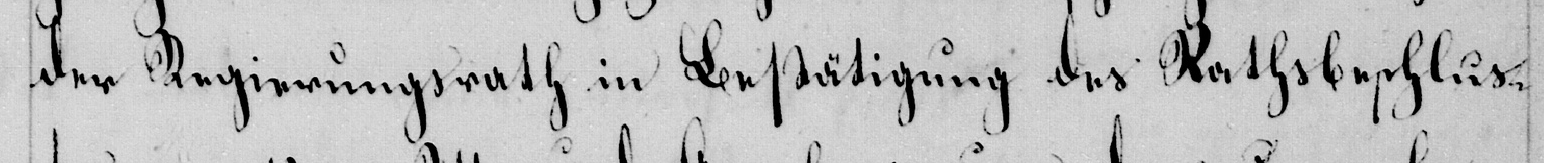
der Regierungsrath in Bestätigung des Rathsbeschluß¬
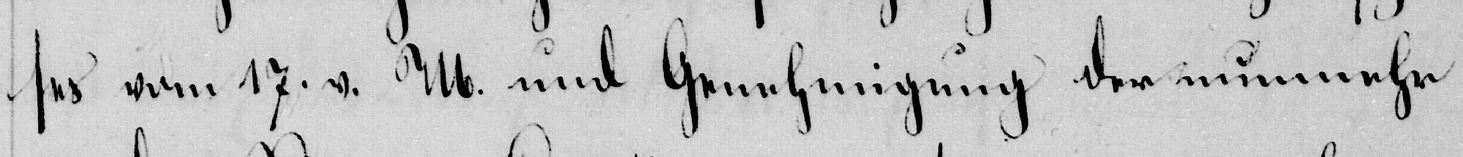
es vom 17. v. M. und Genehmigung der nunmehr
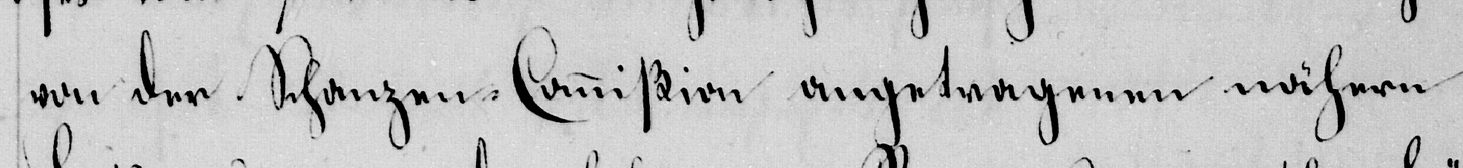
von der Schanzen-Commißion angetragenen nähern
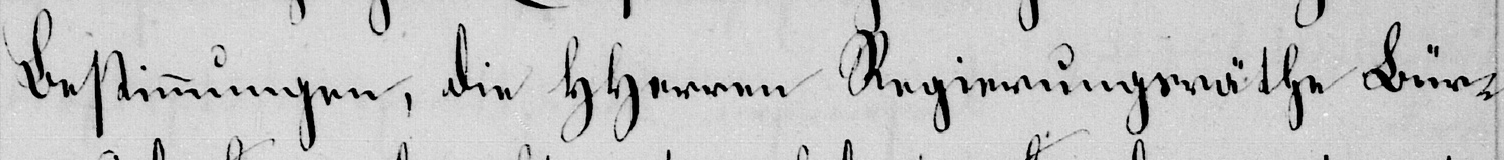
Bestimmungen, die HHerren Regierungsräthe Bür¬
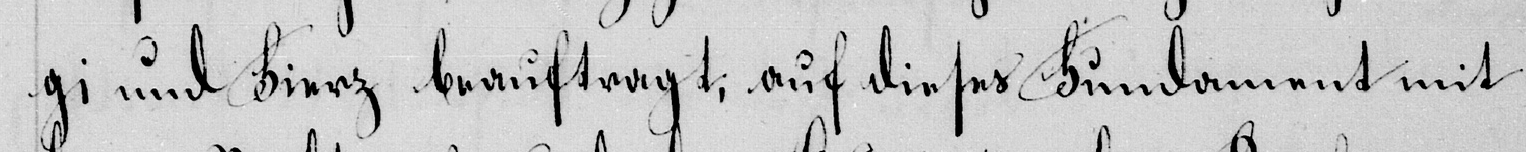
gi und Fierz beauftragt, auf dieses Fundament mit
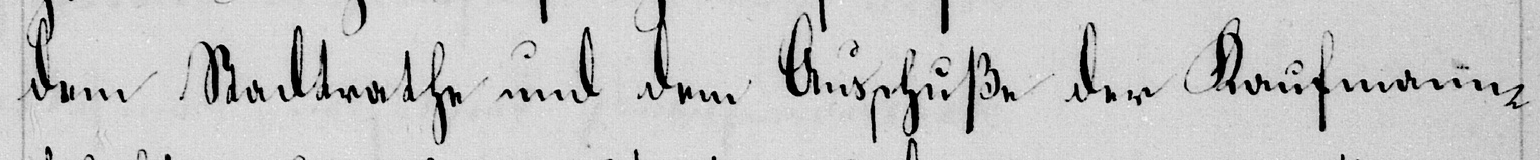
dem Stadtrathe und dem Ausschuße der Kaufmann¬
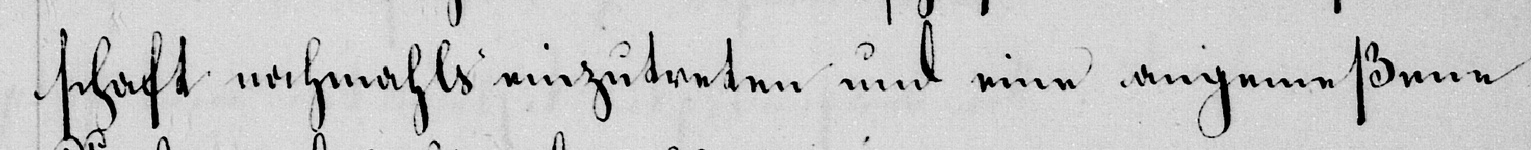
schaft nochmahls einzutreten und eine angemeßene
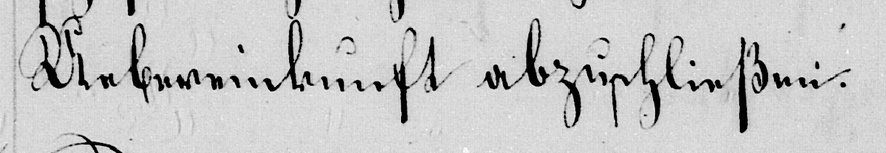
Uebereinkunft abzuschließen.
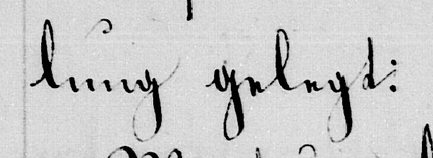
lung gelegt:
